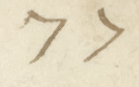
77
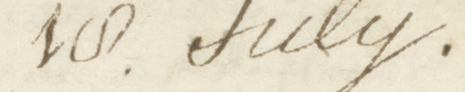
18. July.
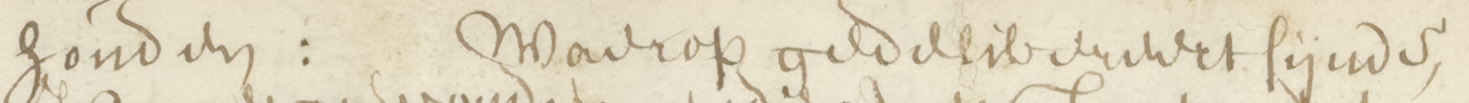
houden: Waerop gedelibereert sijnde,
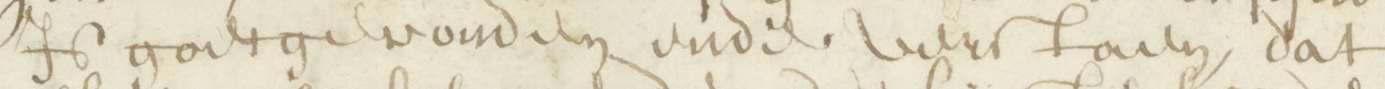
Is goetgevonden ende verstaen, dat
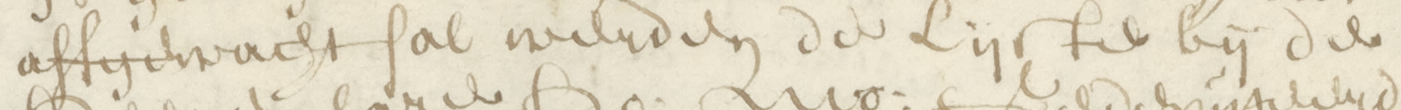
affgewacht sal werden de Lijste bij de
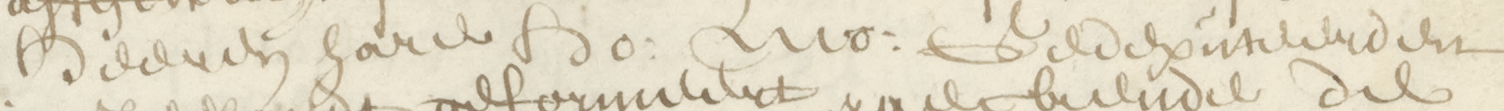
Heeren hare Ho:Mo: Gedeputeerden
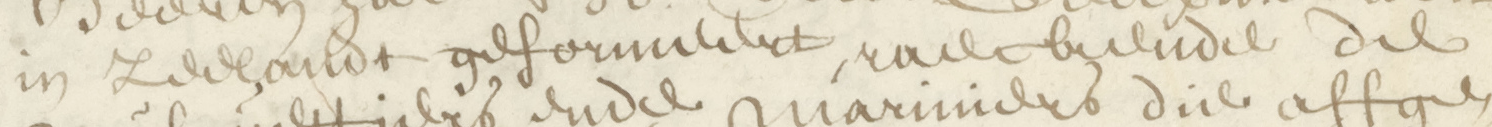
in Zeelandt geformeert, raeckende de
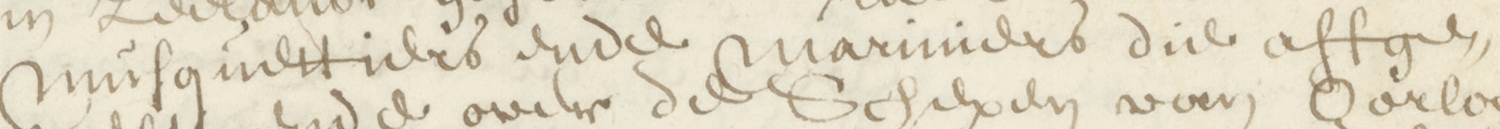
musquettiers ende mariniers die affge„
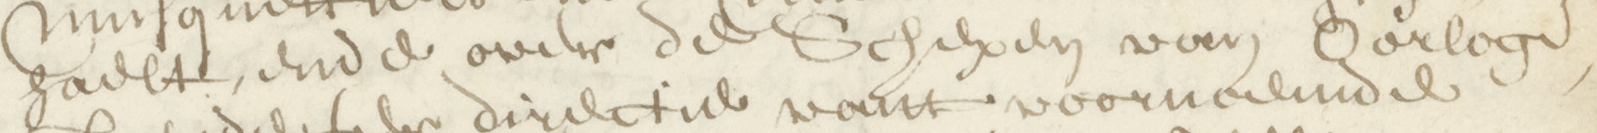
haelt, ende over de Schepen van Oorloge
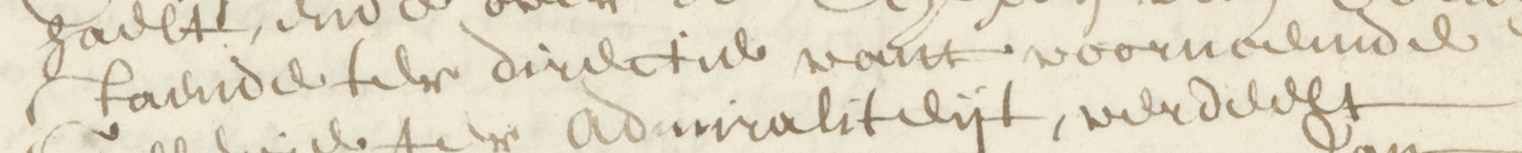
staende ter directie vant voornoemde
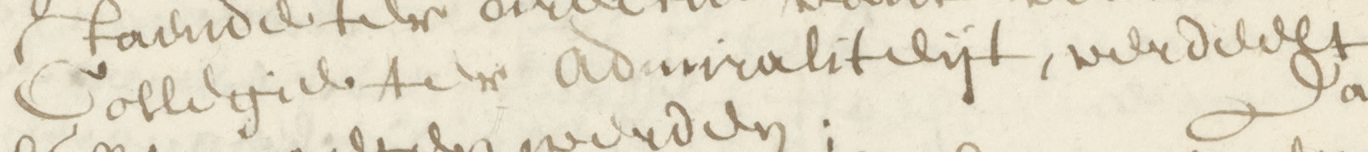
Collegie ter Admiraliteijt, verdeelt
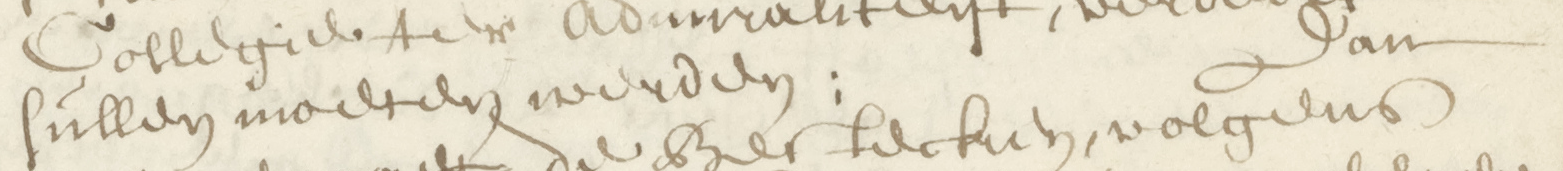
sullen moeten werden: Dan
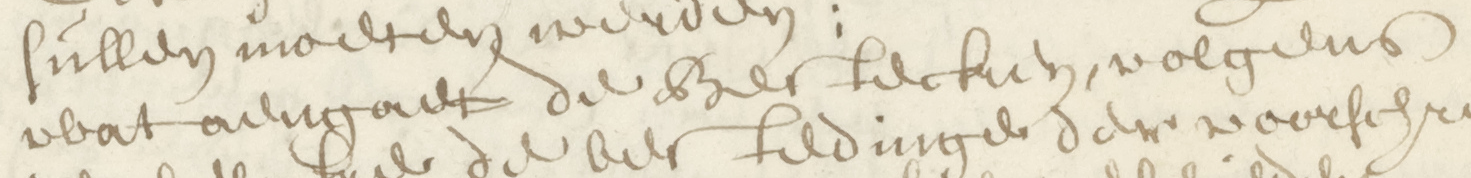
wat aengaet de Bestecken, volgens
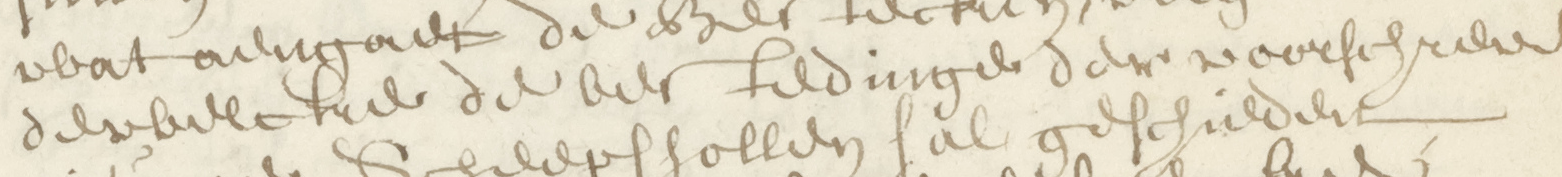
dewelcke de bestedinge der voorschreve
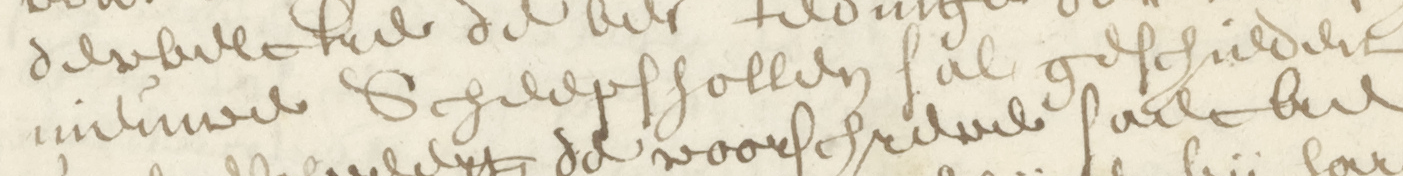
nieuwe Scheepshollen sal geschieden
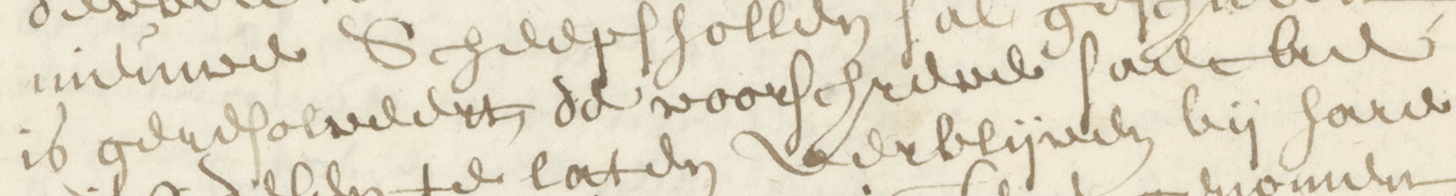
is geresolveert, de voorschreve saecke
